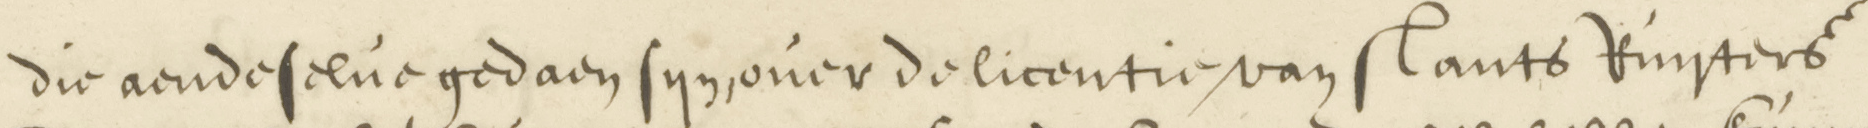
die aen deselue gedaen syn ouer de licentie van slants Ruyters
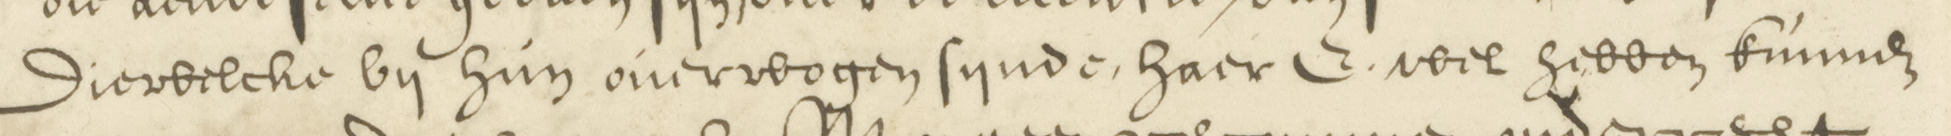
Diewelcke by hun ouerwogen synde, haer E. wel hebben kunnen
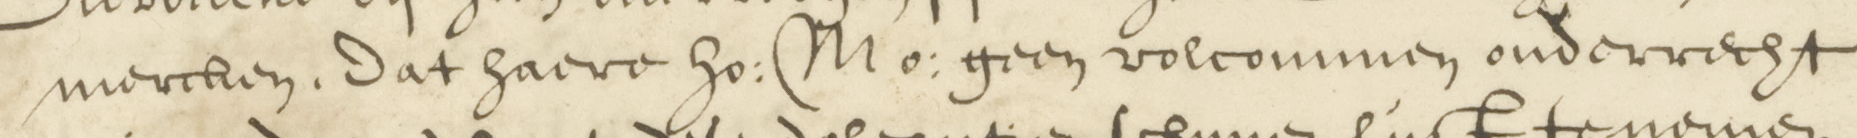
mercken, dat haere ho:Mo: geen volcommen onderrecht
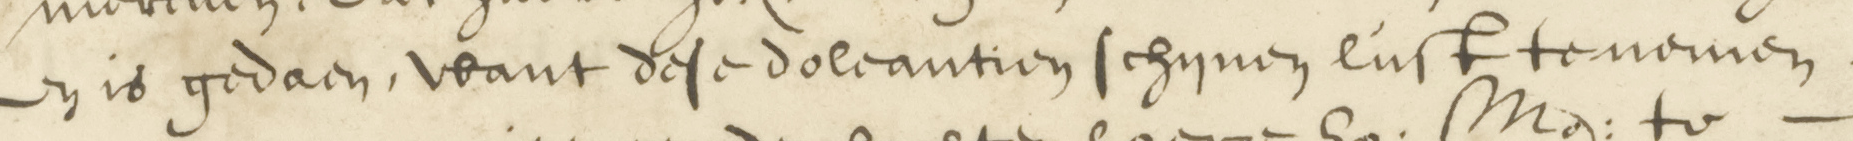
en is gedaen, want dese doleantien schynen lust te nemen
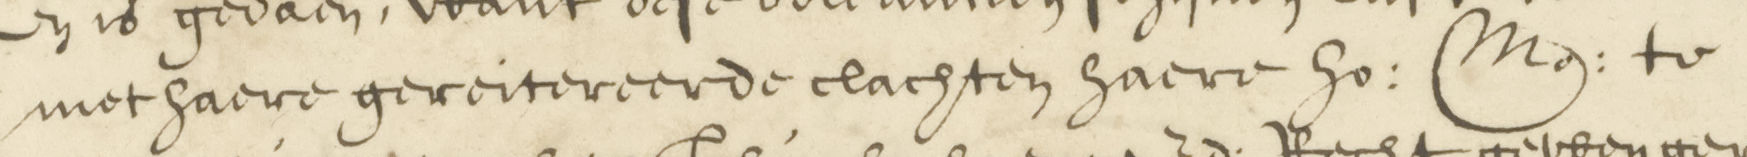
met haere gereitereerde clachten haere ho:Mo: te
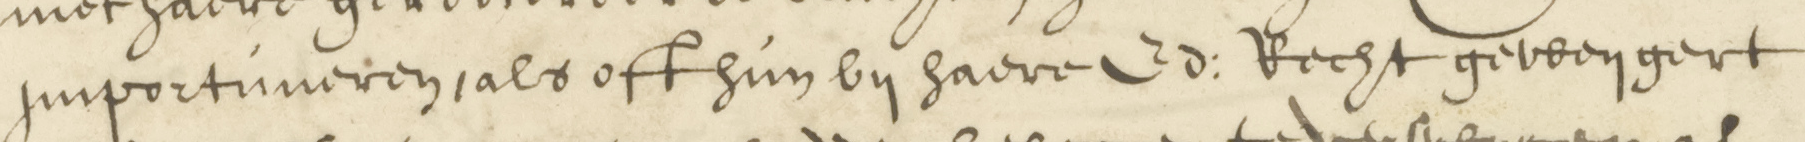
importuneren, als off hun bij haere Ed: Recht geweygert
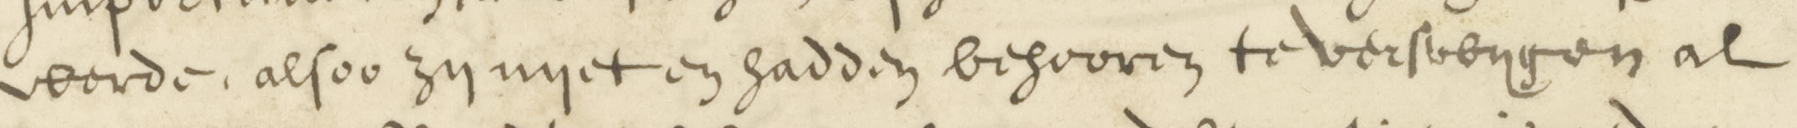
werde, alsoo zy nyet en hadden behooren te verswygen al
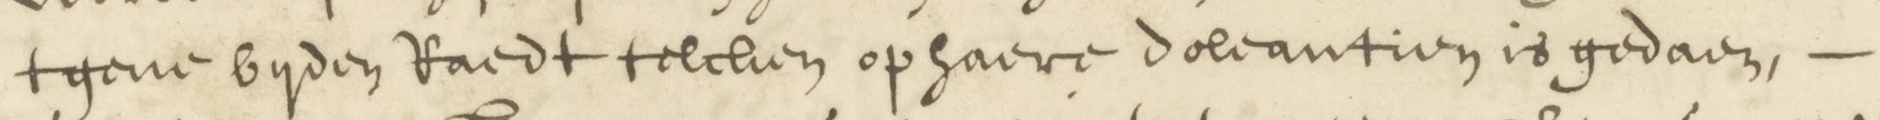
tgene byden Raedt telcken op haere doleantien is gedaen, —
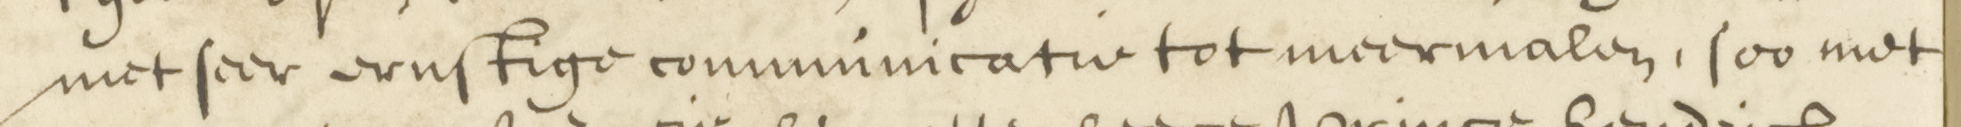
met seer ernstige communicatie tot meermalen, soo met
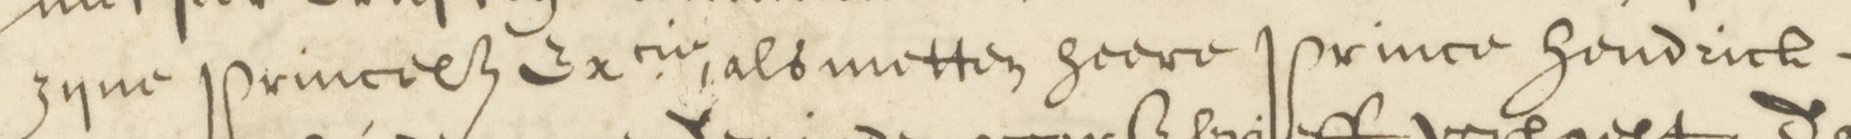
zyne Princel Excie., als metten heere Prince hendrick
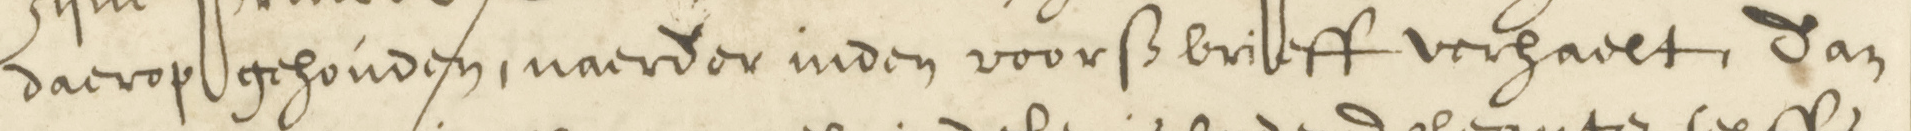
daerop gehouden, naerder inden voors brieff verhaelt, Dan
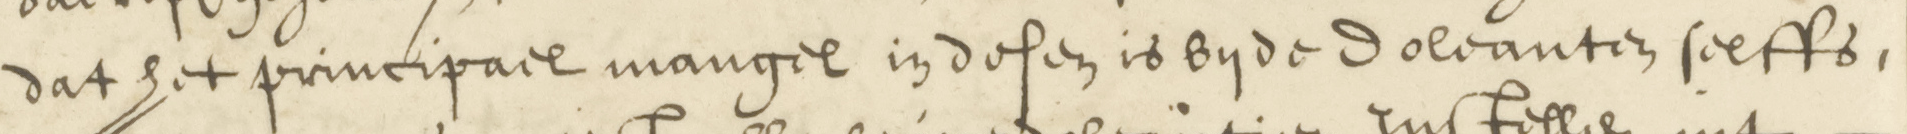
dat het principael mangel in desen is byde Doleanten selffs,
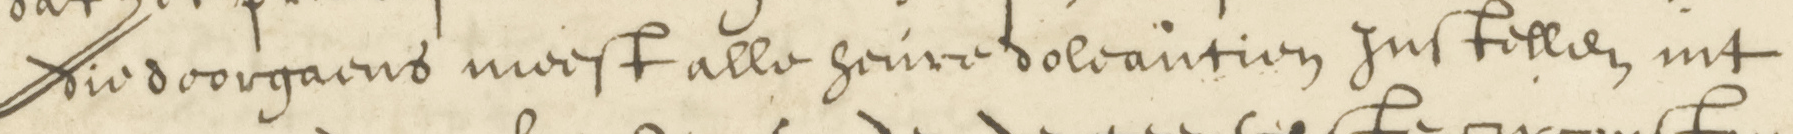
die doorgaens meest alle heure doleantien Instellen int
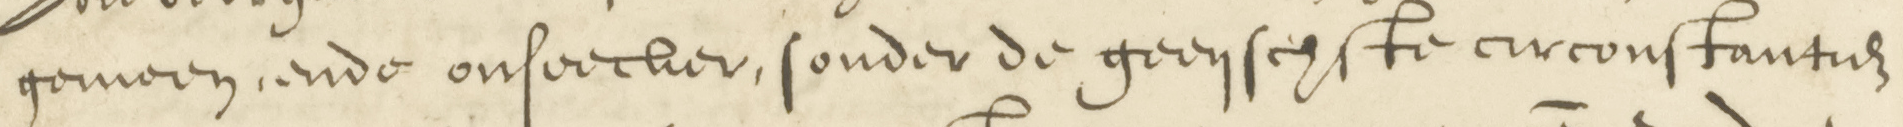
gemeen, ende onseecker, sonder de geeyschste circonstantien
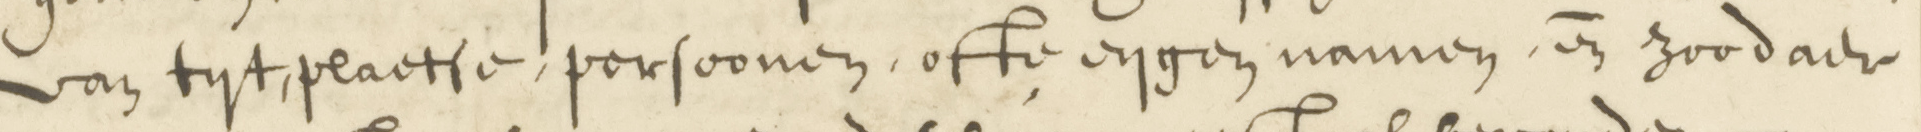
van tyt, plaetse, persoonen, ofte eygen namen, en zoo daer
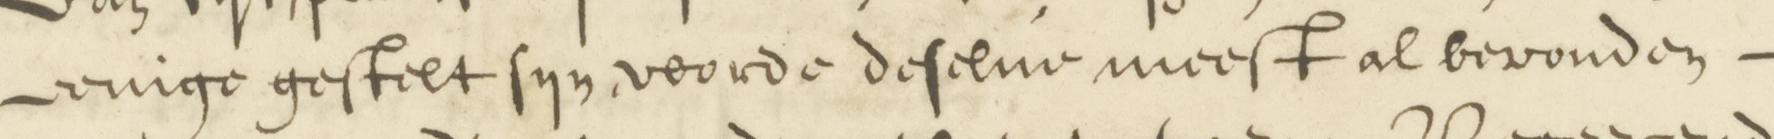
eenige gestelt syn, worde deselue meest al bevonden -
